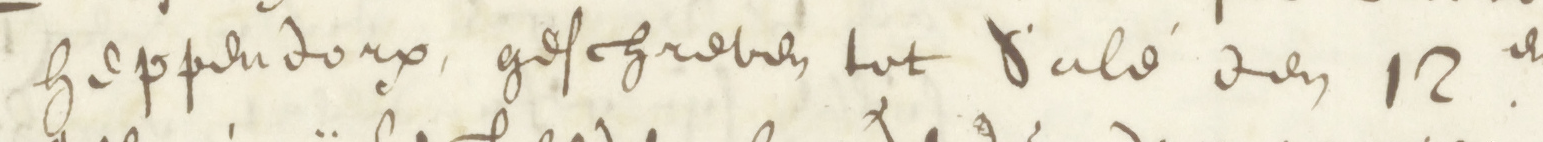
Heppendorp, geschreven tot Salé den 12en
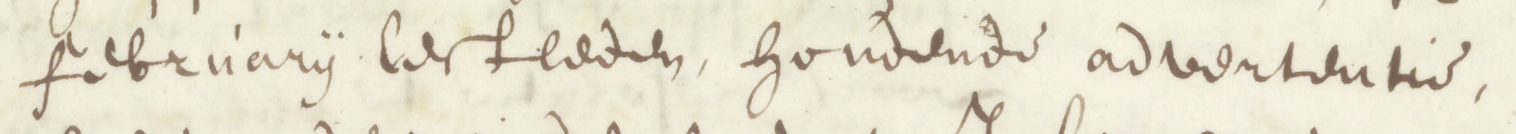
februarij lestleden, houdende advertentie,
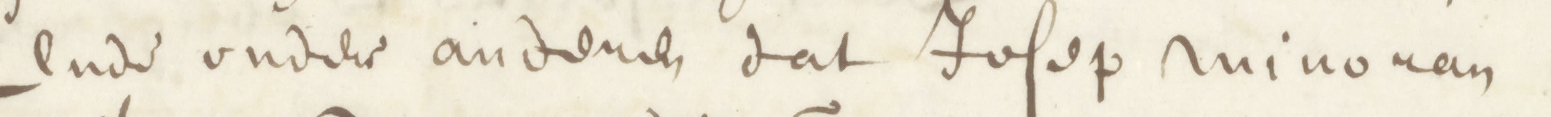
ende onder anderen dat Josep Minoran
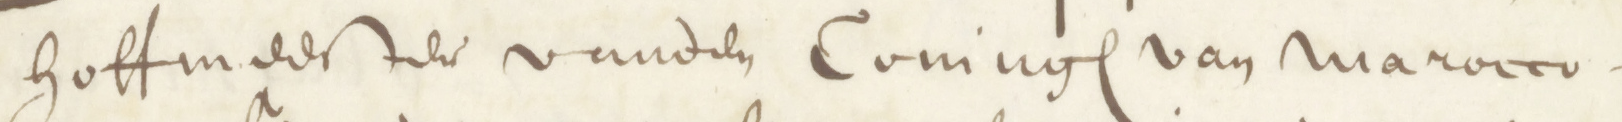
hoffmeester vanden Coningh van Marocco
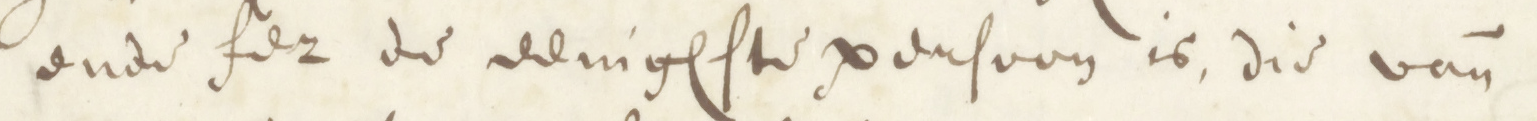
ende fez de eenighste persoon is, die van
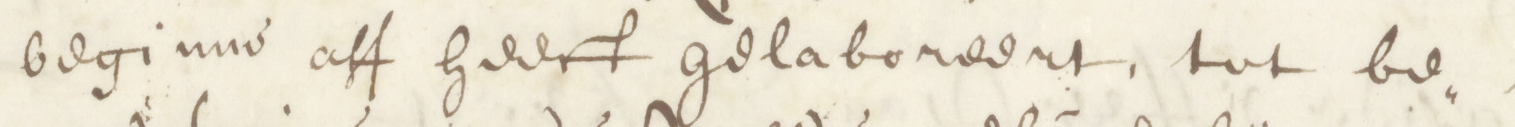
beginne aff heeft gelaboreert, tot be„
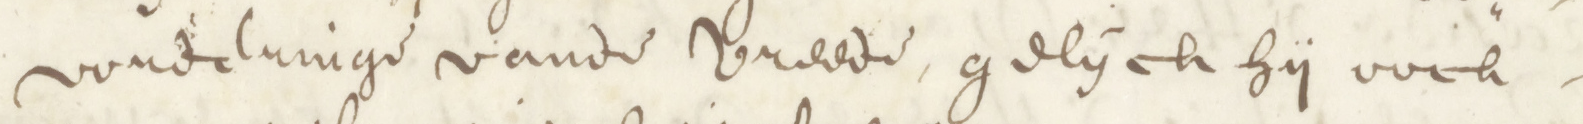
vorderinge vande vreede, gelijck hij oock
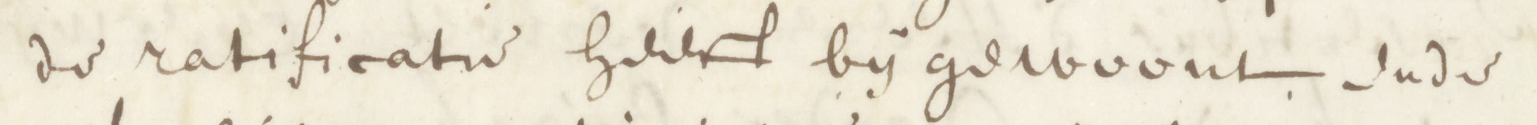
de ratificatie heeft bij gewoont ende
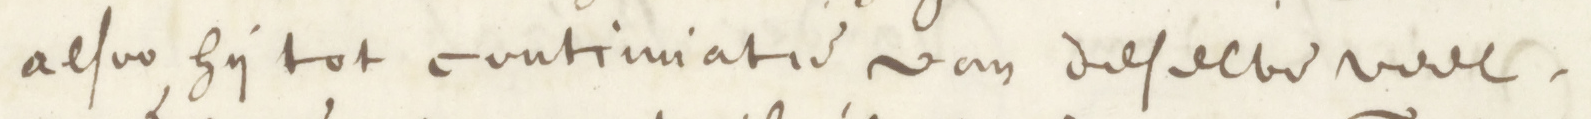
alsoo hij tot continuatie van deselve veel
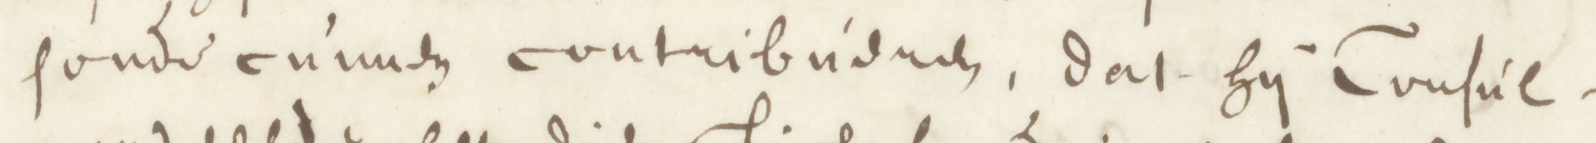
soude cunnen contribueren, dat hij Consul
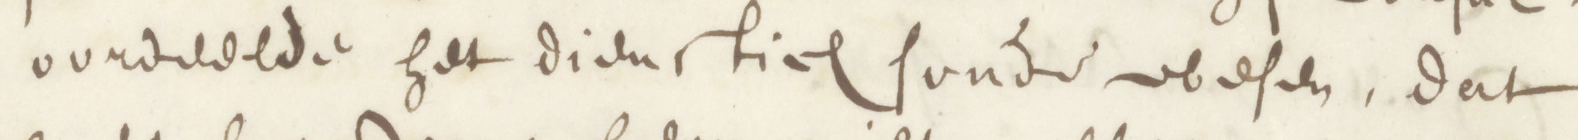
oordeelde het dienstich soude wesen, dat
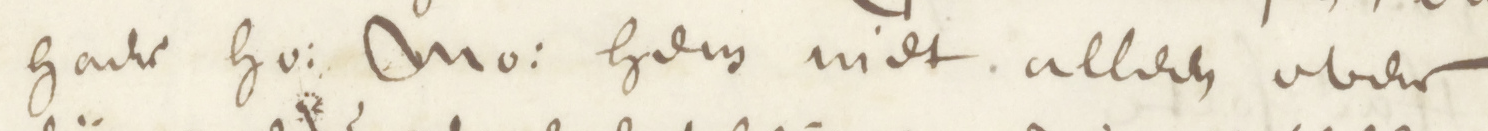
haer ho:mo: hem niet alleen over
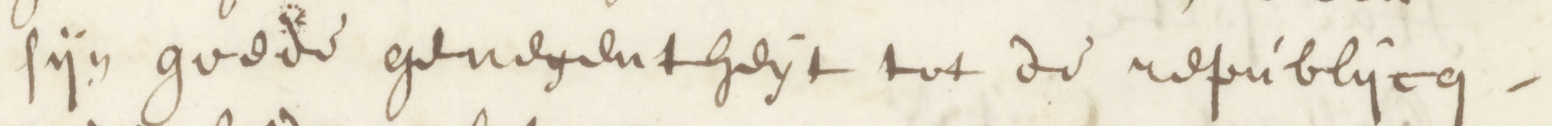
sijn goede genegentheijt tot de republijcq
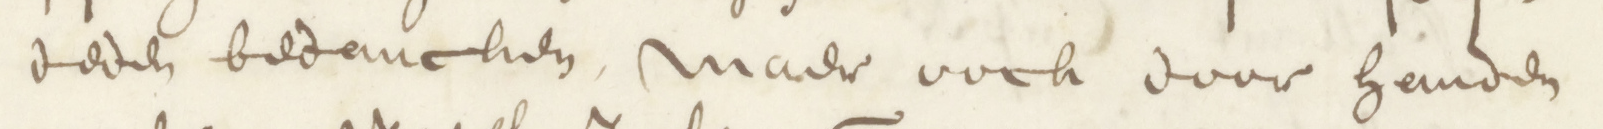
deden bedancken, maer oock door handen
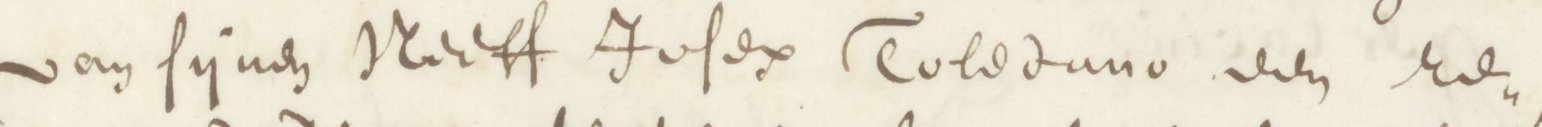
van sijnen Neeff Josep Toleduno een re,,
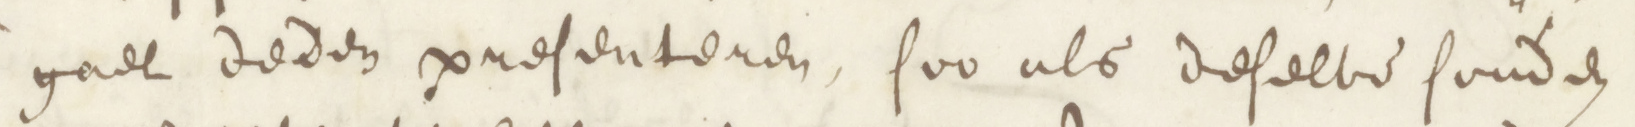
gael deden presenteren, soo als deselve souden
